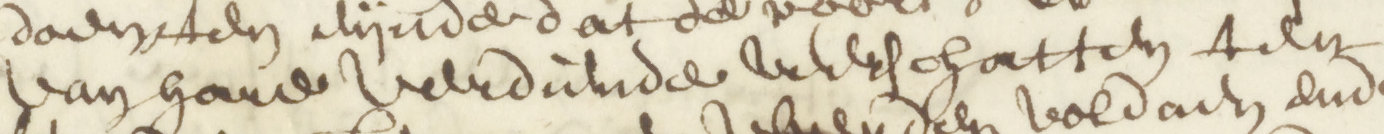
van hare verdiende veerschatten ten
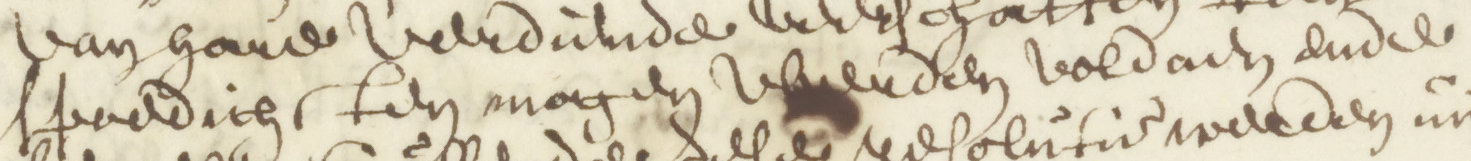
spoedichsten mogen werden voldaen ende
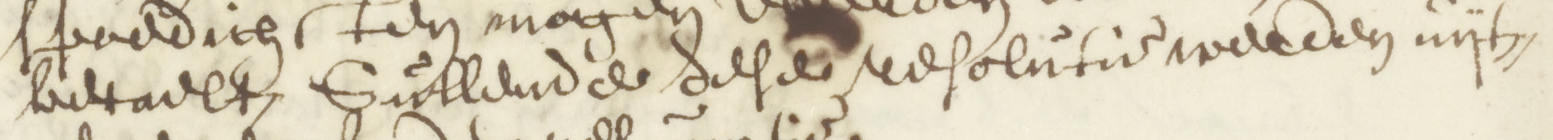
betaelt, Sullende dese resolutie werden uijt„
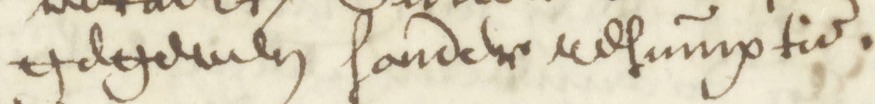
gegeven sonder resumptie.
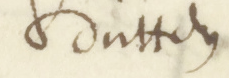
Hutten
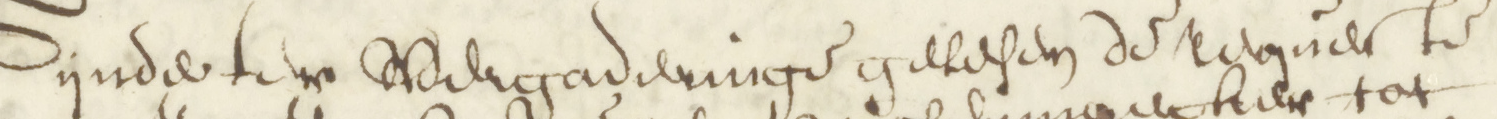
Sijnde ter Vergaderinge gelesen de requeste
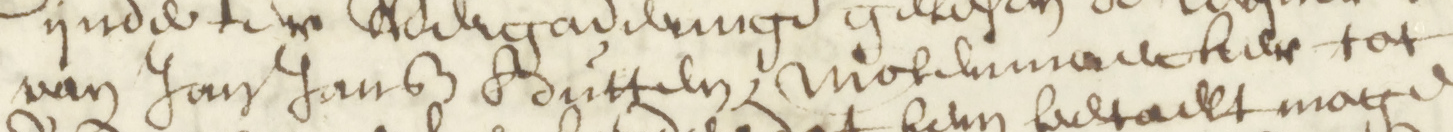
van Jan Jansz Hutten, Molenmaecker tot
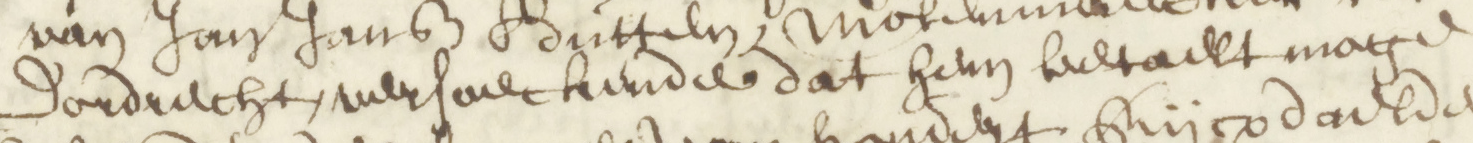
Dordrecht, versoeckende dat hem betaelt moge
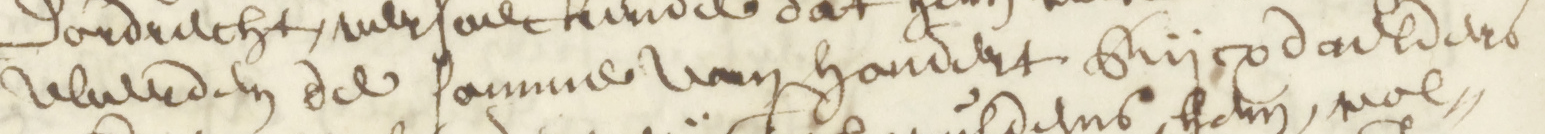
werden de somme van hondert Rijcxdaelders
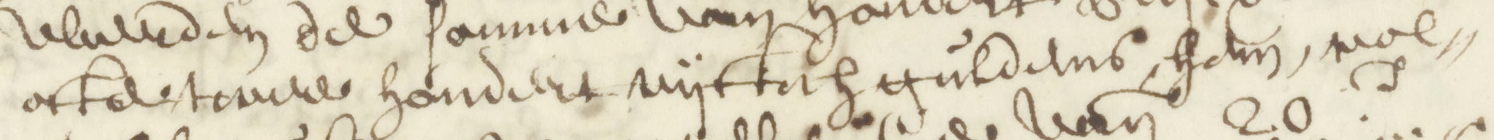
offe twee hondert vijftich guldens, hem we„
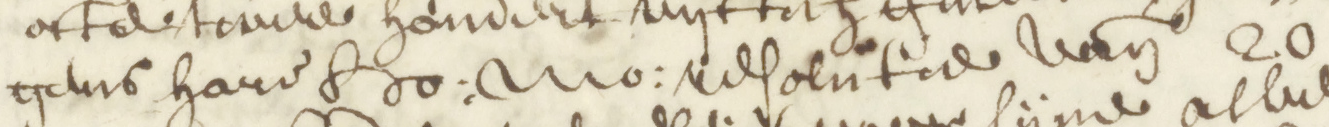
gens hare Ho:Mo: resolutie van 20en
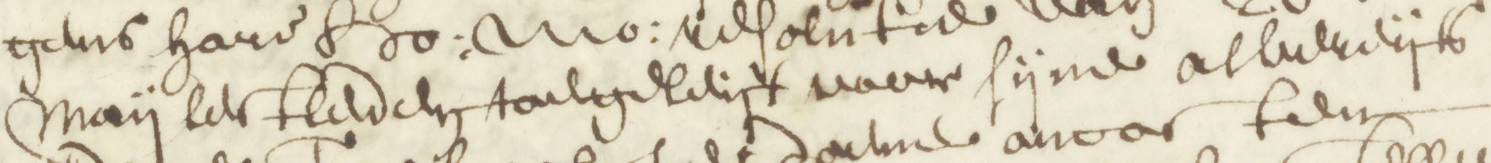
Maij lestleden toegeleijt voer sijne albereijts
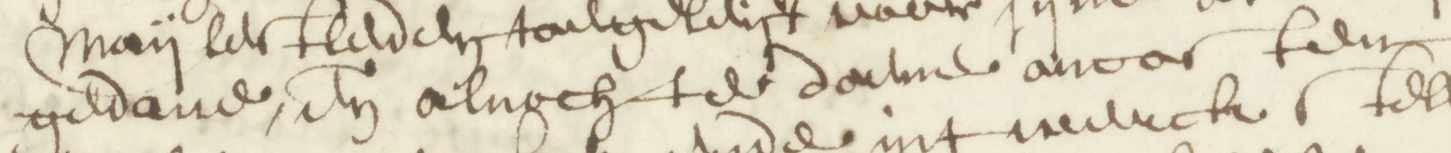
gedane, en alnoch te doene oncosten
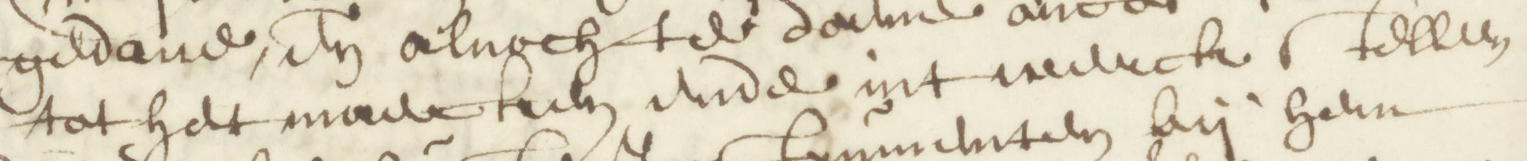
tot het maecken ende int werck stellen
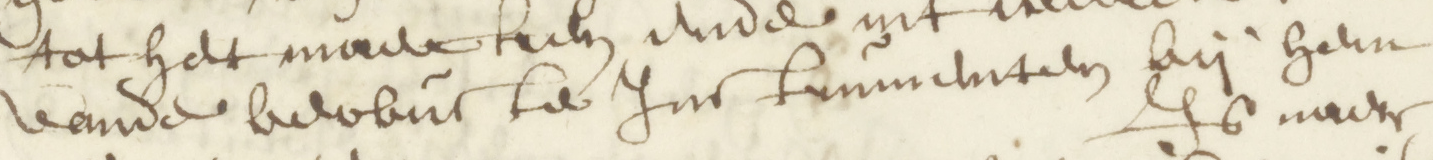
vande bewuste Instrumenten bij hem
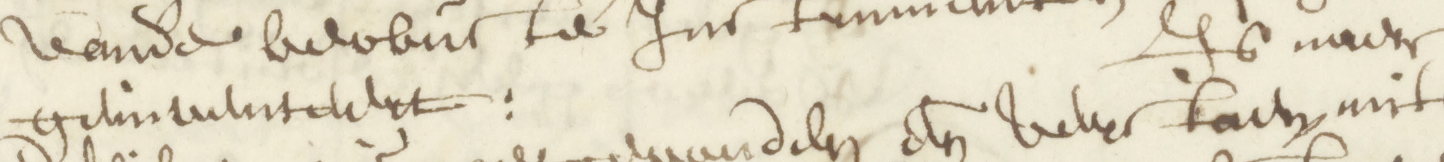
geinventeert: Is naer
